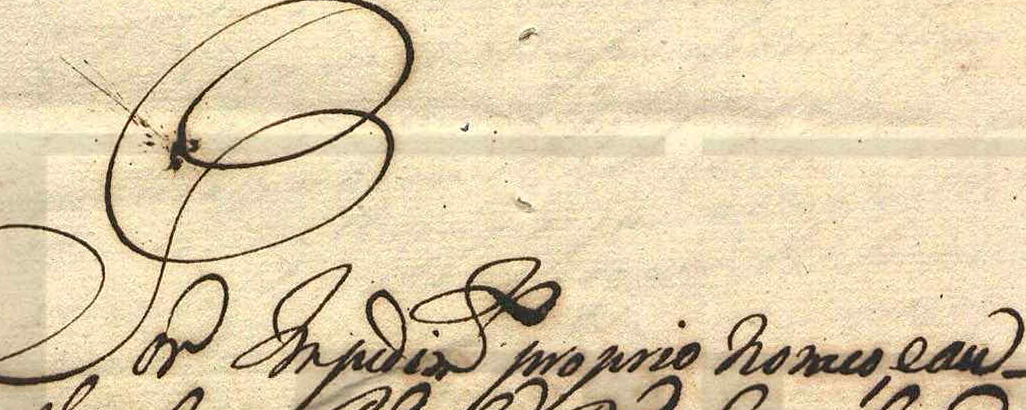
Por Impedim.to proprio nomeo, e au
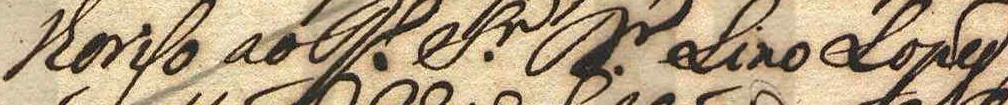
thoriso ao P.e S.r D.r Lino Lopes
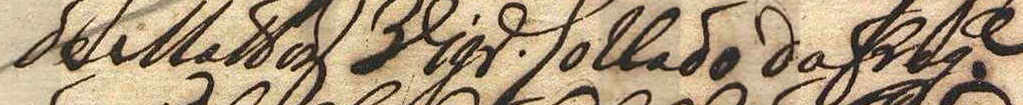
de Mollez Vigr.o Collado da freg.a
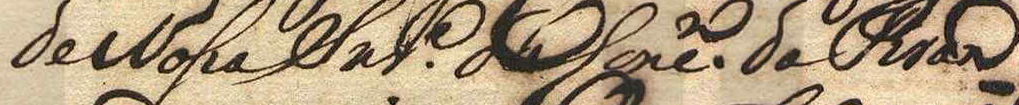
de Nossa Snr.a de Conc.n do Piran
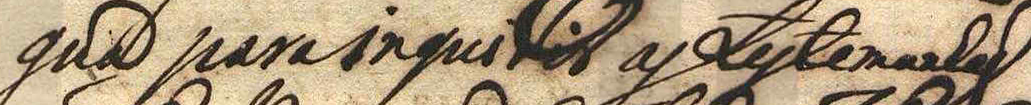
gua para inquirir as testemunhas
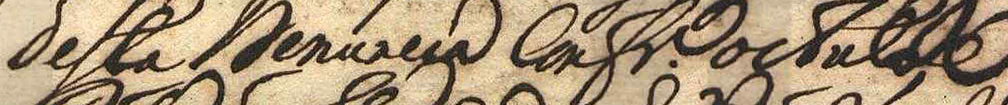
desta Denuncia Confr.e o Auto, e
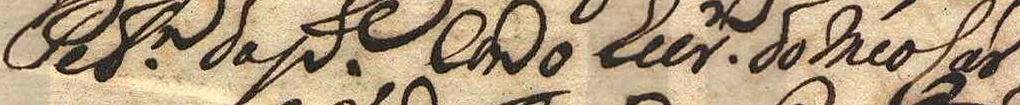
Pet.n da p.te com o Escr.m do meo Car
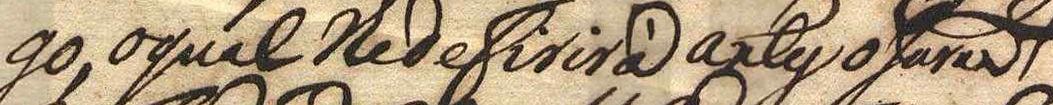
go, o qual lhe defirirá antes o Juram.to
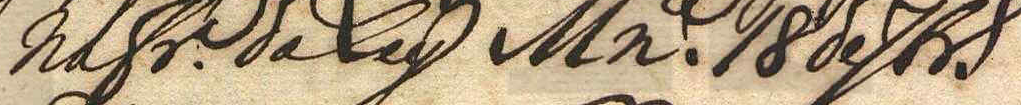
na fr.a da Ley Mn.a 18 de 7 Jnl
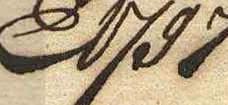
E 1797
